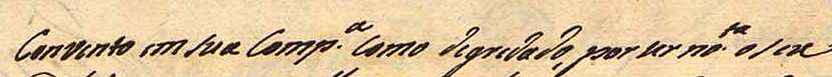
Convento em sua Comp.a como degredado, por ser no.ta o seu
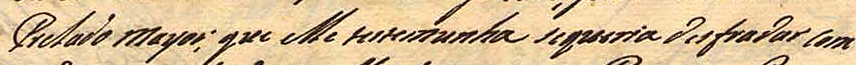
Prelado mayor; que elle testemunha se queria desfradar com
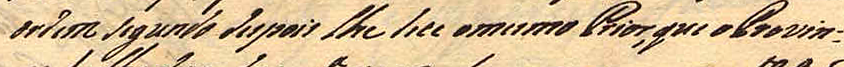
ordem segundo despois lhe hee o mesmo Prior, que o Provin
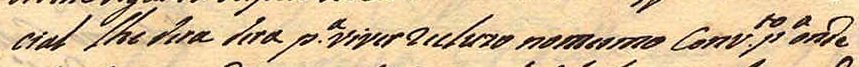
cial lhe dera dera p.a viver recluzo no mesmo conv.to pa onde
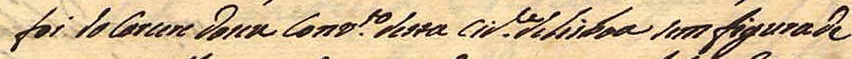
foi do Carcere do seu Conv.to desta cid.e de Lisboa sem figura de
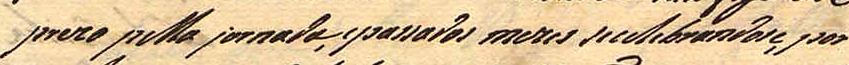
prezo pella jornada, e passados mezes se celebrandose, por
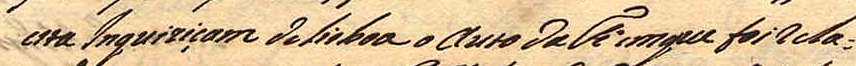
esta Inquiziçam de Lisboa o auto da Fé em que foi rela
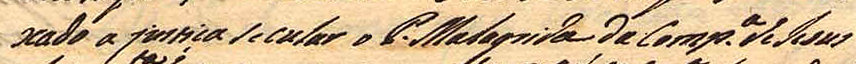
xado a justiça secular o P. Malagrida da Comp.a de Iesus
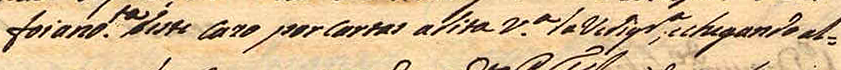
foi a no.ta deste cazo por cartas a dita v.a da Vidigra; e chegando al
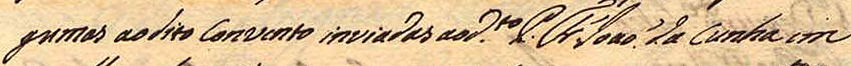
gumas ao dito Convento inviadas ao d.to P. Fe. Ioaõ da Cunha em
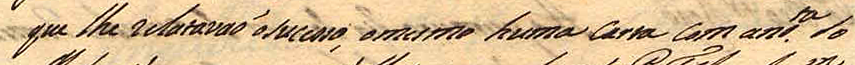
que lhe relatavaõ o sucesso, o mesmo huma carta com a no.ta do
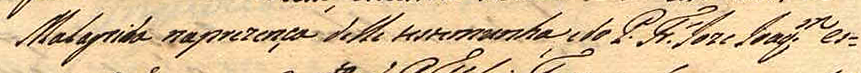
Malagrida na prezença delle testemunha, e do P. Fr. Ioze Ioaq.m es
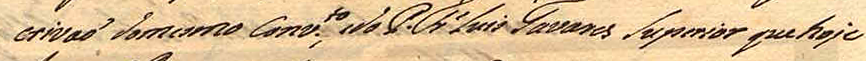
crivaõ do mesmo conv.to, e do P. Fr. Luis Tavares superior que hoje
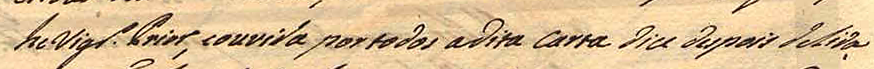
he Vigr.o Prior, e ouvida por todos a dita carta dice despois de lida,
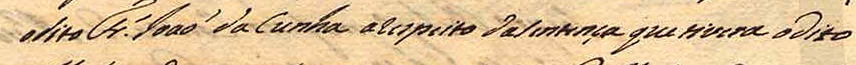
o dito Fr. Ioaõ da Cunha a respeito da sentença que tivera o dito
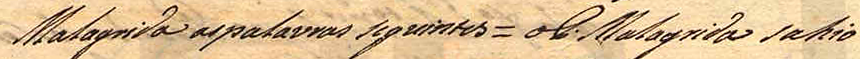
Malagrida as palavras seguintes = o P. Malagrida sahio
